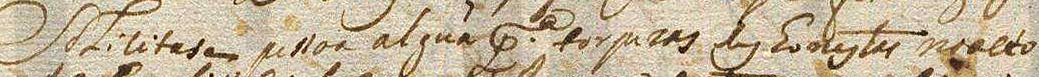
Solicitase pessoa alguā p.a torpezas deshonestas no acto
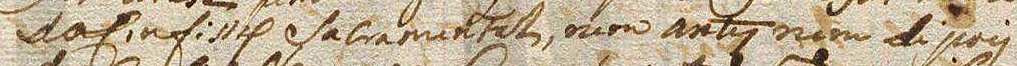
da Confissaꝭ sacramentaL, nem antes nem dipois
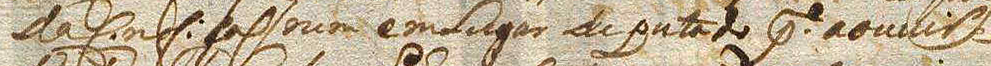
da Confiçaꝭ nem em Lugar deputado p.a a ouuir e
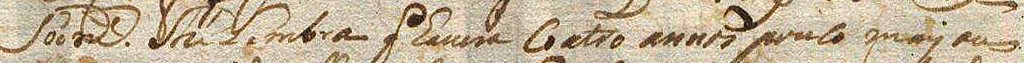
Sóomte. So se Lembra q̄ hauera Coatro annos pouco majs ou
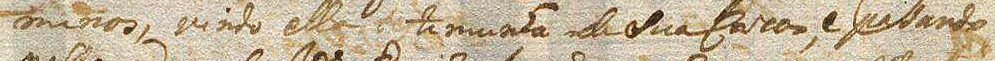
menos, vindo ella testemunha de sua Caza, e pasando
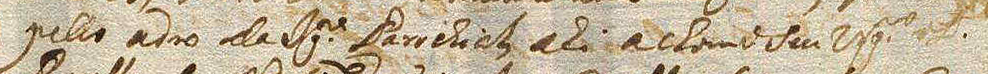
pello adro da Ig.ra Parochial, ahi achou o seu Vig.ro o P.
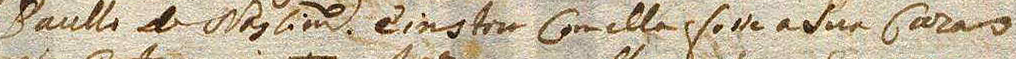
Paullo do Nascim.to e instou Com ella fosse a sua Caza
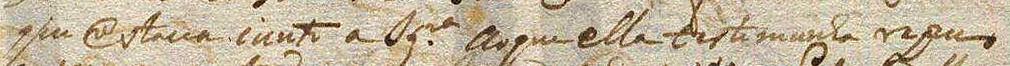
que Estaua iunto a Ig.ra ao que ella testemunha repu
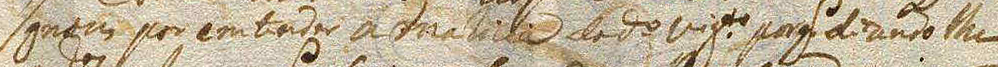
gnou por emtender a malicia do d.o vig.ro porq̄. dizendo lhe
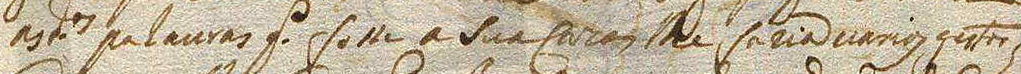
as d.as palauras q̄. fosse a sua Caza lhe fazia uarios gestos
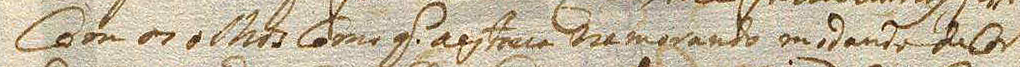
Com os olhos Como q̄. a estaua namorando modando de Cor
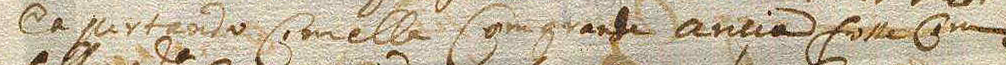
e apertando Com ella Com grande ancia fosse Com
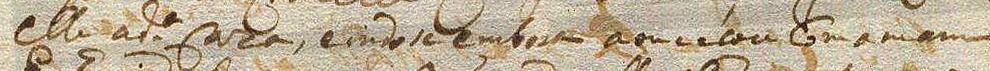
elle a d.a Caza, e indose embora ameaçou Com a mam
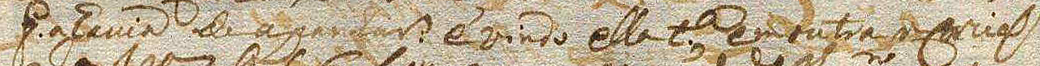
q̄. a hauia de apanhar. e vindo ella t.a em outra oCaziaꝭ
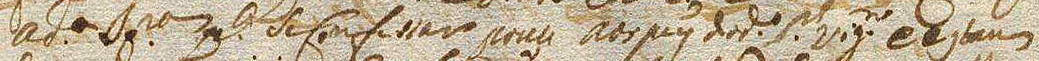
a d.a Ig.ra p.a se Confessar posece aos peés do d.o p.e vig.ro e estan
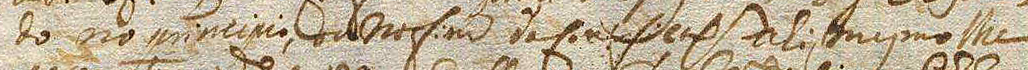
do no principio, ou no fim da Confiçaꝭ ahi mesmo lhe
